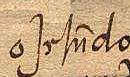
o JeJū do
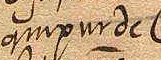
quipur de
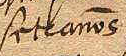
sete anōs
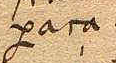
ꝑa ça.
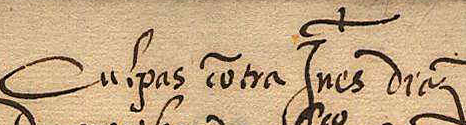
Culpas cōtra Jnes diaz
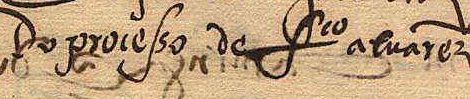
Do processo de fco aluarez
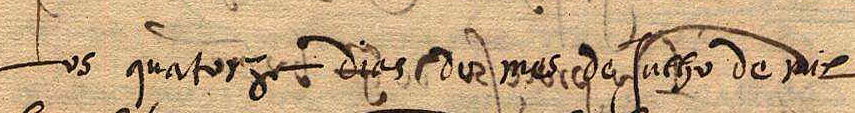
Aos quatorze dias do mes de Julho de mil
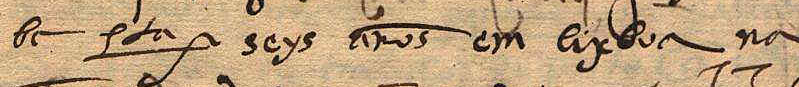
bc Lta e seys an̄os em lixboa na
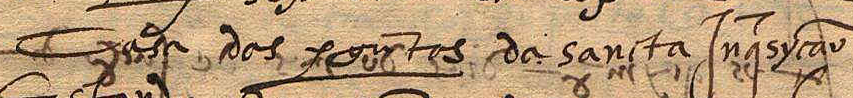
Casa das ꝑgūtas da sancta Jnq̄syção
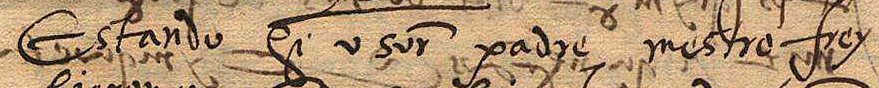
Estando hi o sor̄ padre mestre frey
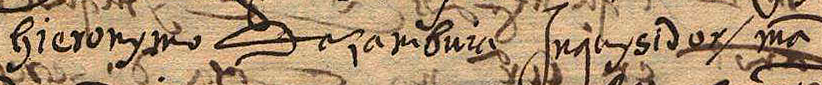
hieronymo dazambuia Jnquysidor / mā
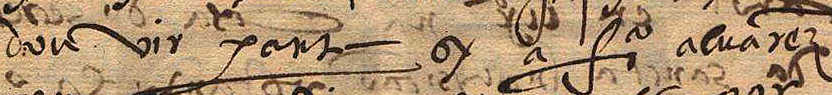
dou vir ꝑante sy a frco aluarez
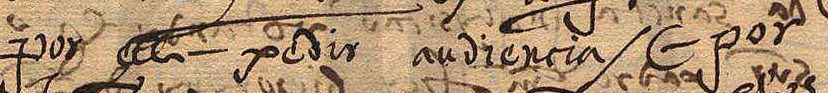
por elle pedir audiencia / E por
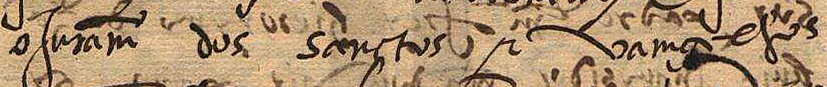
o Juramto dos sanctos evamgelhos
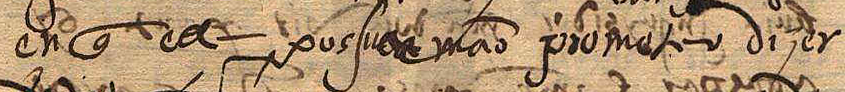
en q̄ ele pos sua mão prometeo dizer
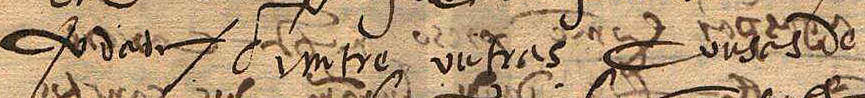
ꝟdade / e emtre outras Cousas de
